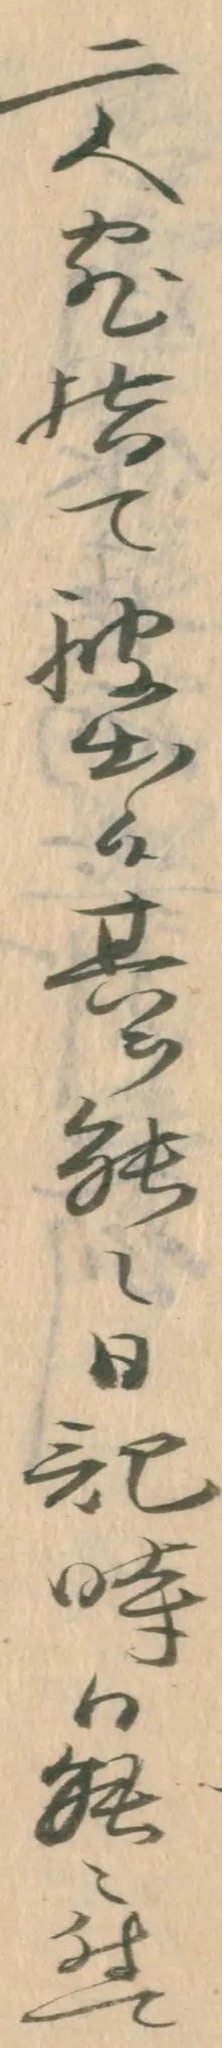二人宛指て被出候其ヲ能々日記時日能々付て
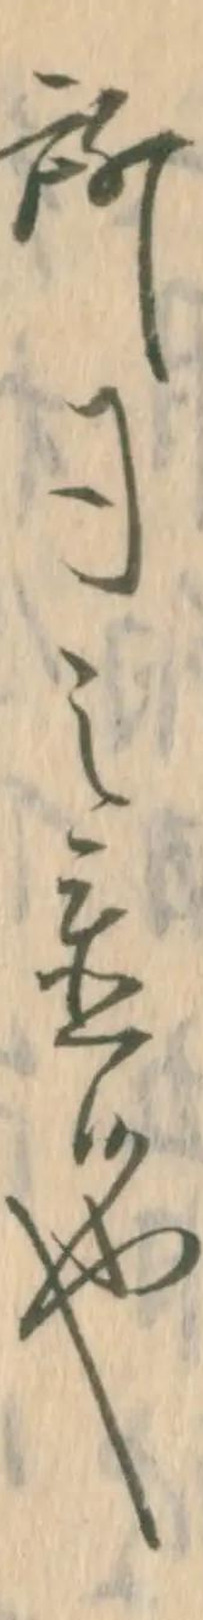所司之置候也
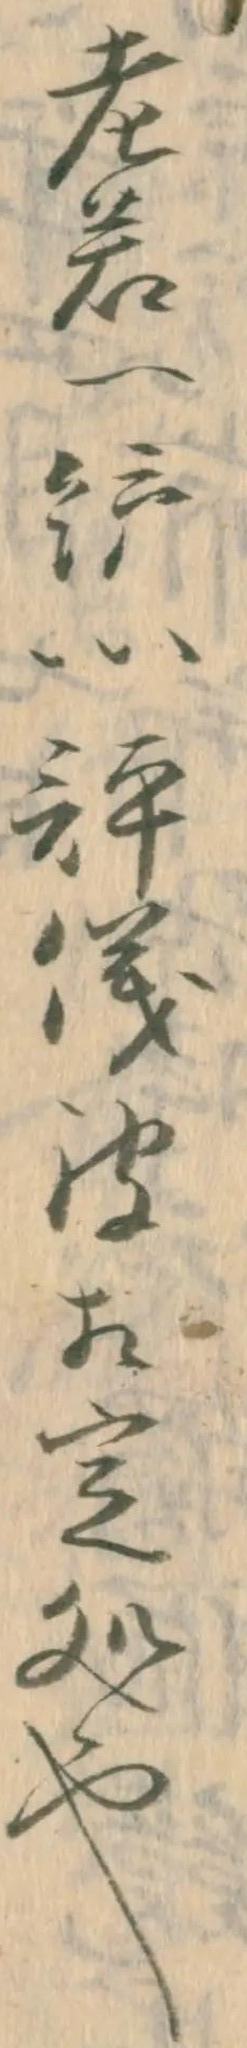老若一統以評議被相定処也
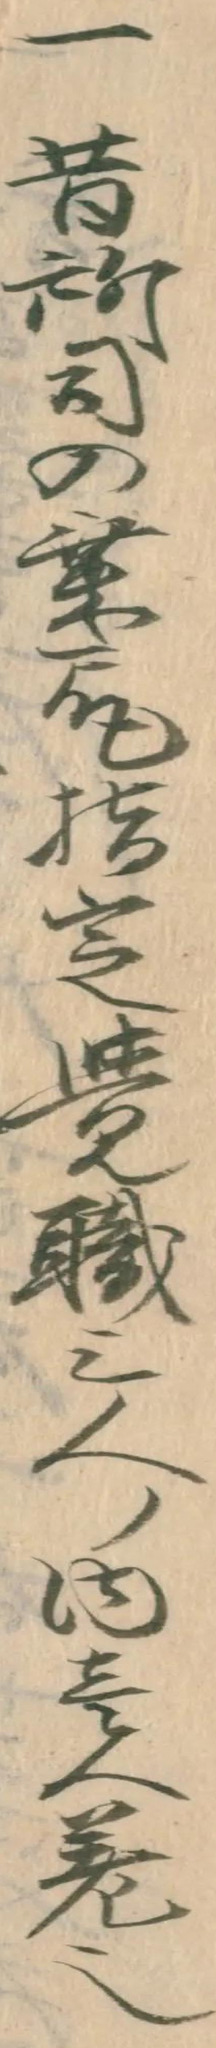一昔所司の乗尻指定覚職三人ノ内壱人差之
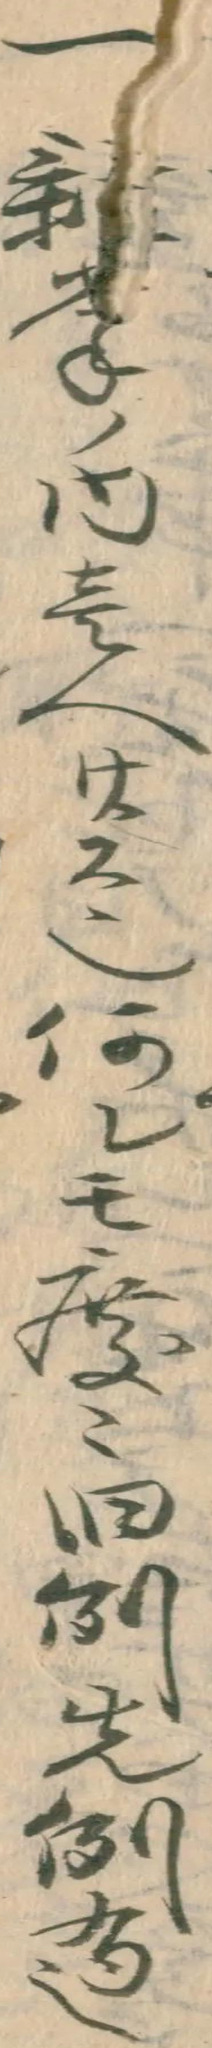一雑掌ノ内壱人サス也何レモ度々旧例先例有之
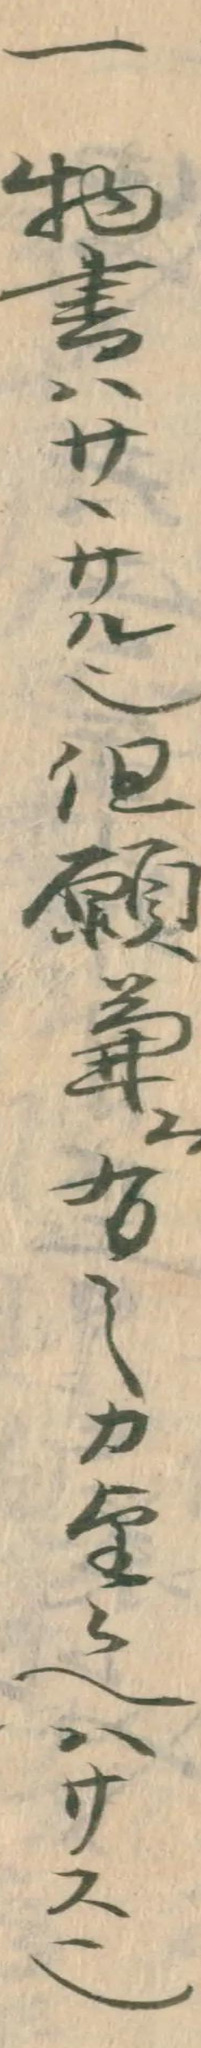一物書ハサヽサル也但願兼而有之カ望候ヘハサス也
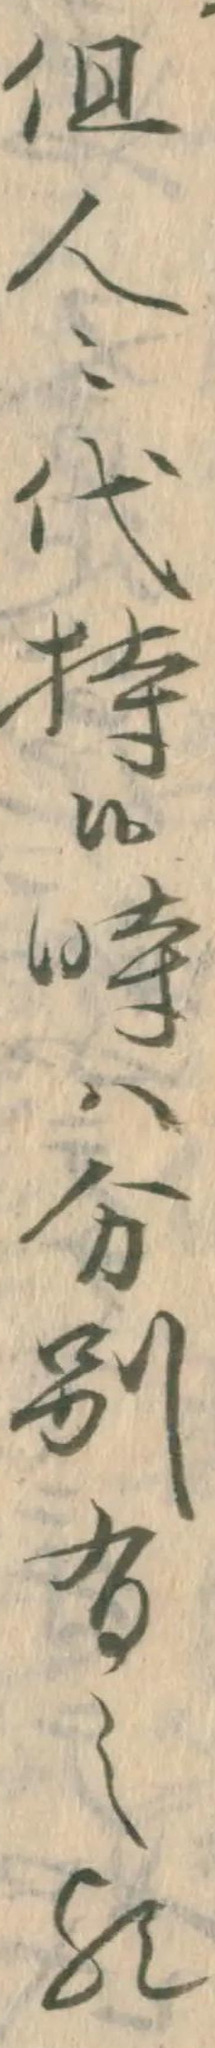但人々代持候時ハ分別有之歟
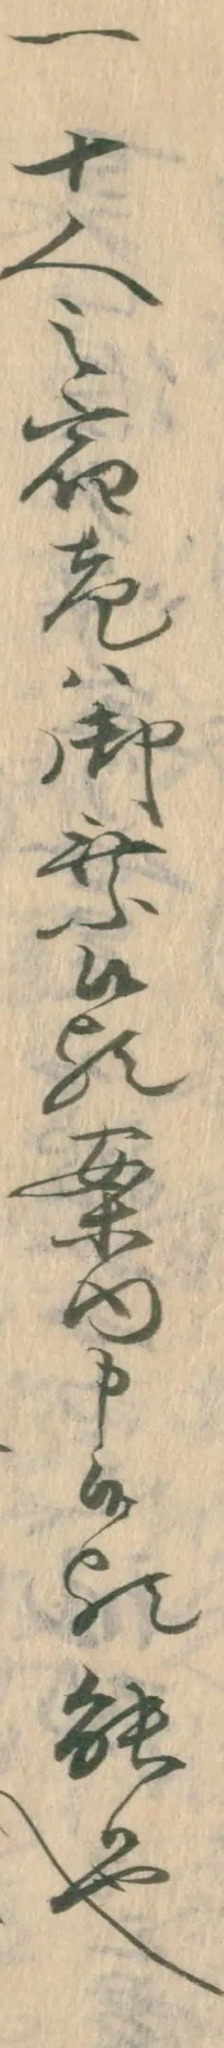一十人之宿老ハ御乗候歟案内申候歟能候也
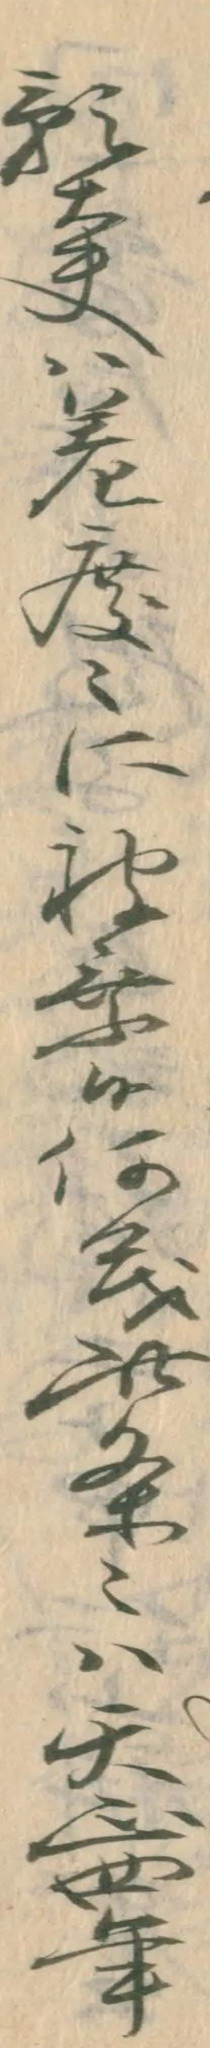一預大夫ハ差度々に被乗候何も此条々ハ天正四年
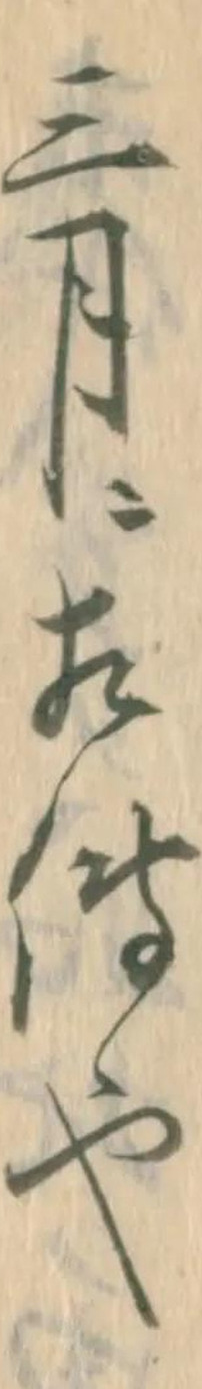三月ニ相伝也
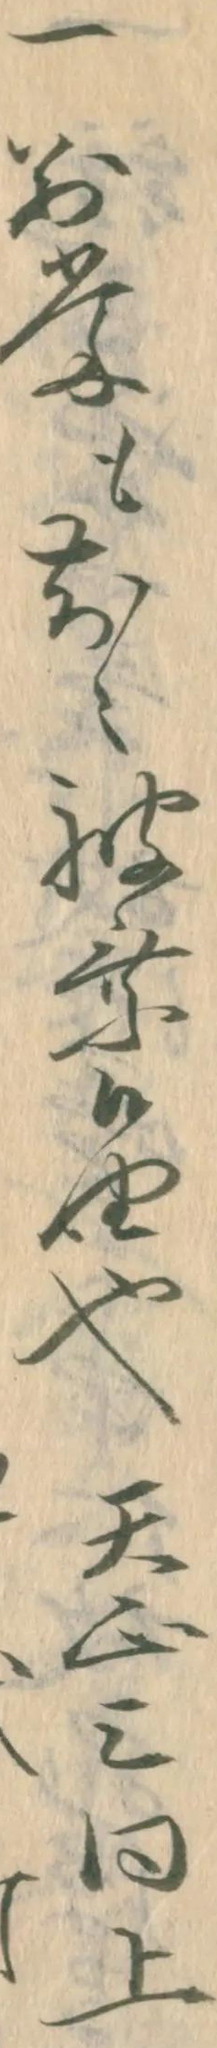一別掌も前々被乗候由也天正三同上

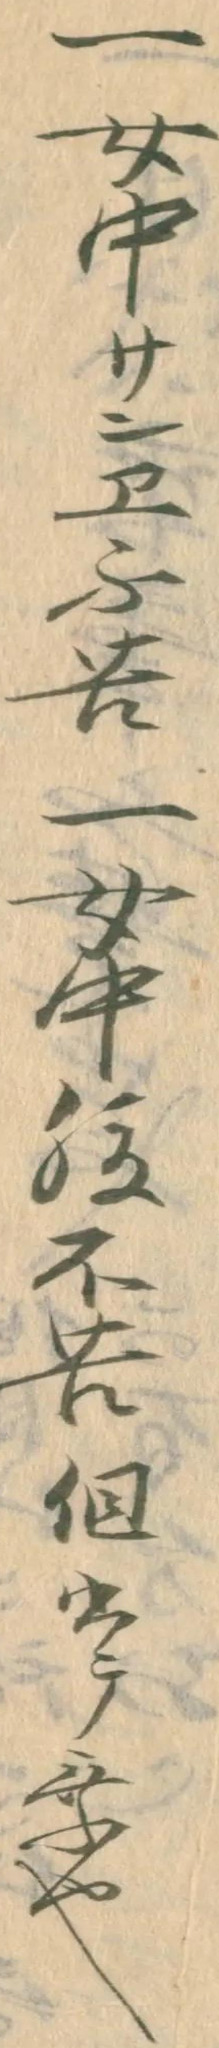一女中サンエ不苦一女中腹不苦但し出テ乗也
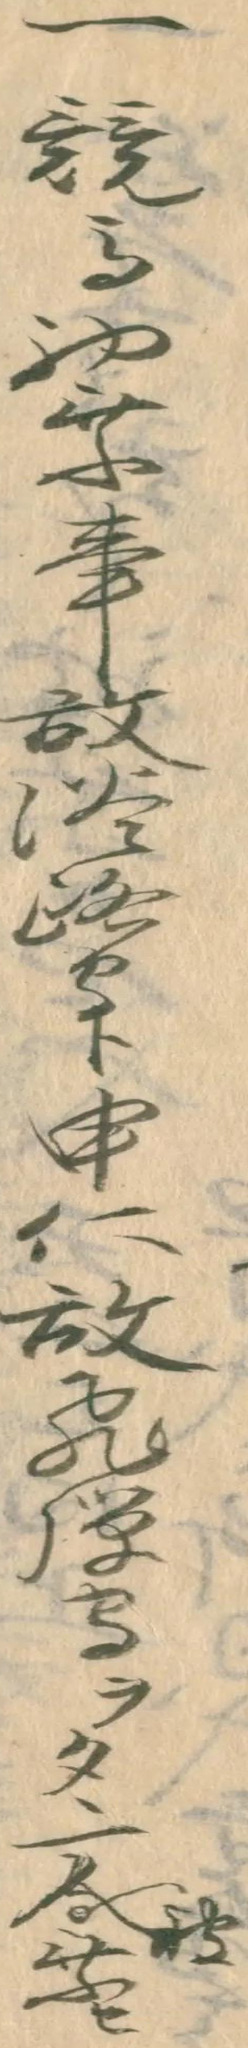一競馬初乗事故淡路守ト申仁故飛騨守ヲタヽ一人◦乗セ
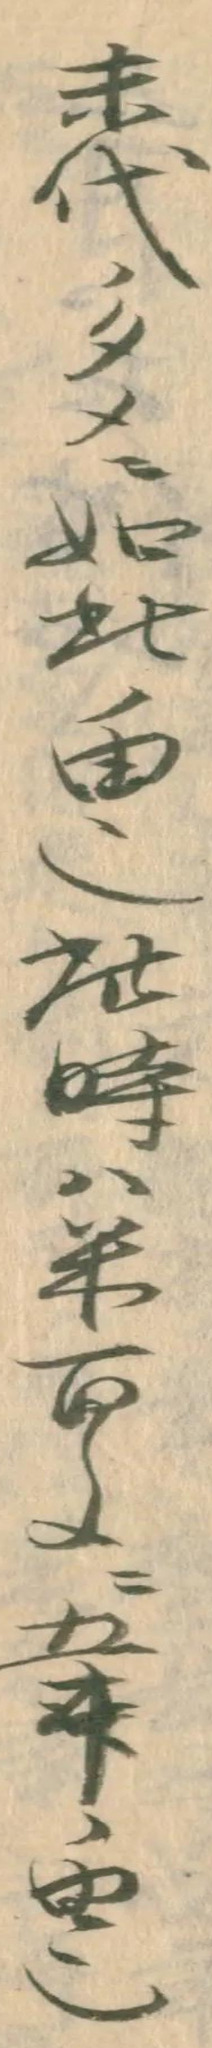末代ノタメニ如此ノ由也此時ハ米百文ニ五升ノ由也
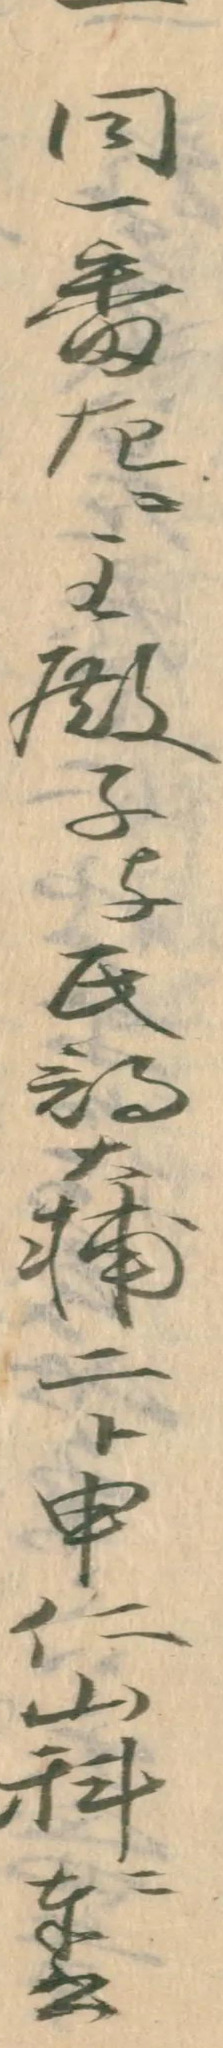一同一番左ニ主殿子と民部大輔二ト申仁山科ニ奉公
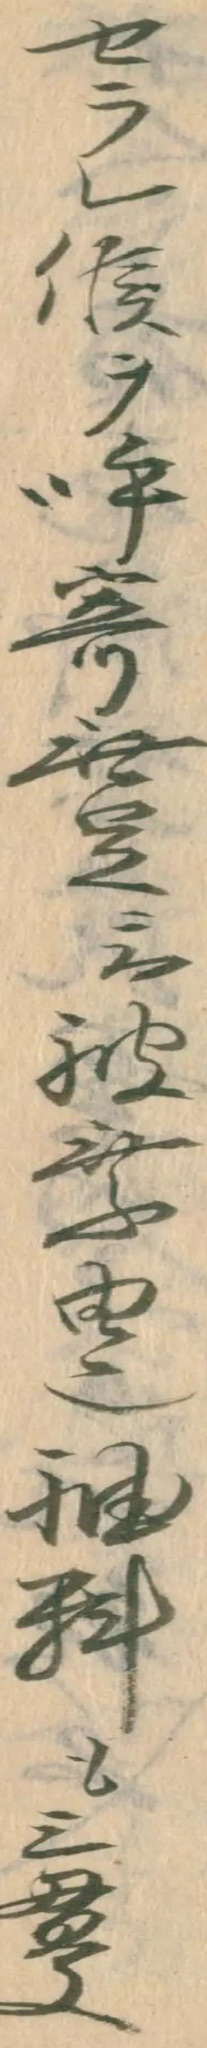セラレ候テ呼寄此足ニ而被乗由也袖料も三貫文
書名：賀茂社記録. 第12冊
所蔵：国立国会図書館 National Diet Library, JAPAN
